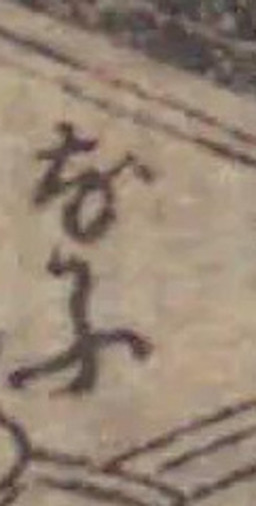なかふ
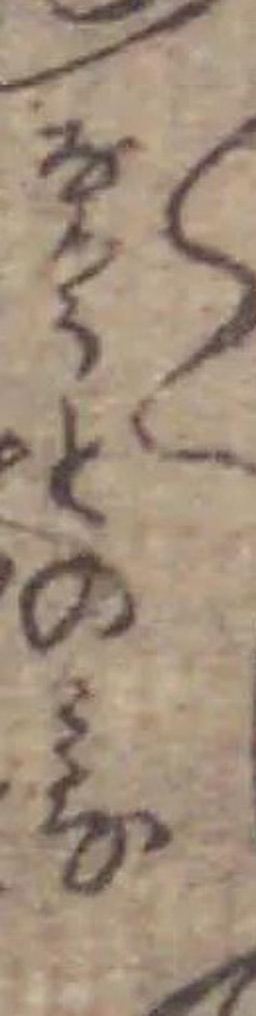なかうとのみな
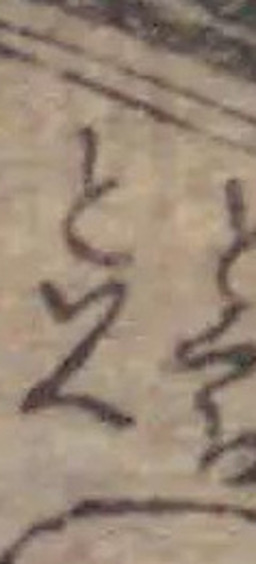といへ
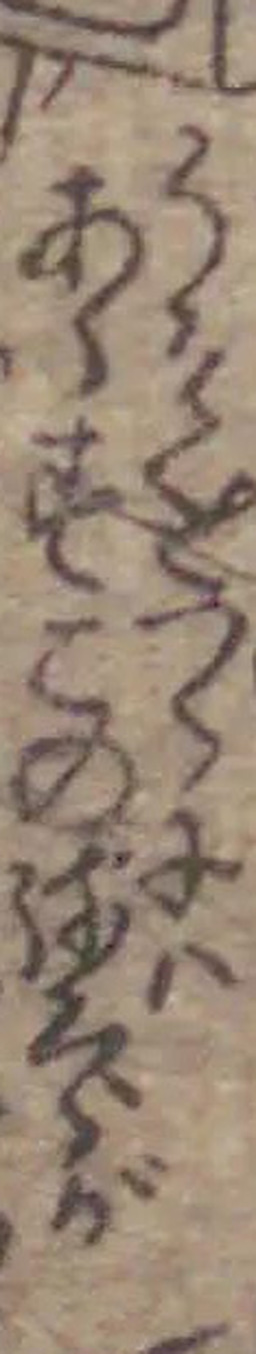あらすこの弥二郎が
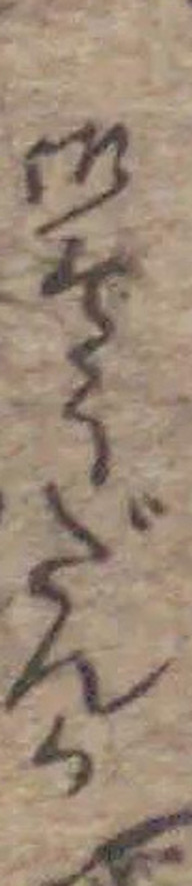御そうだんか
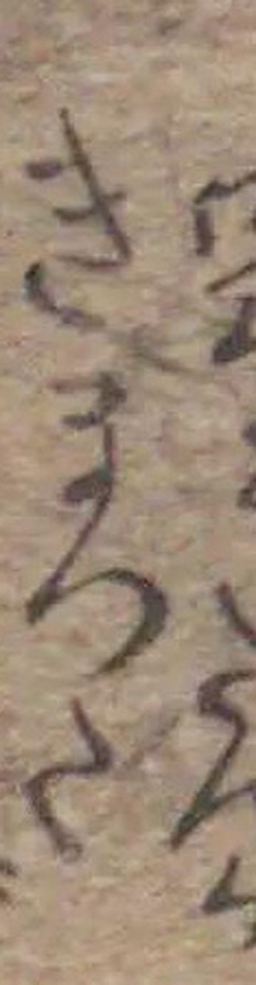きまつた
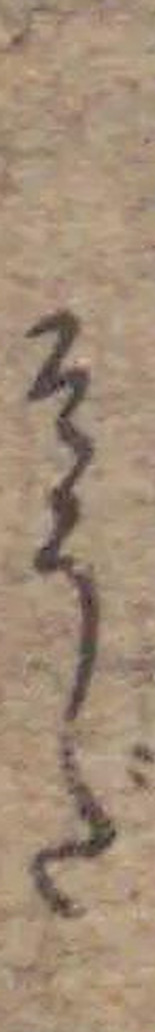そうだ
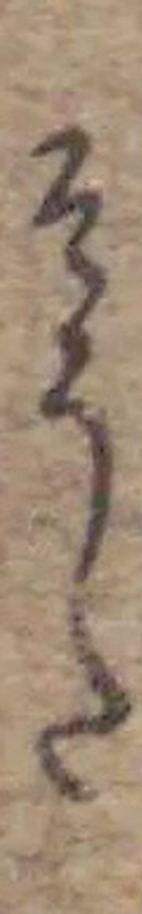そうだ

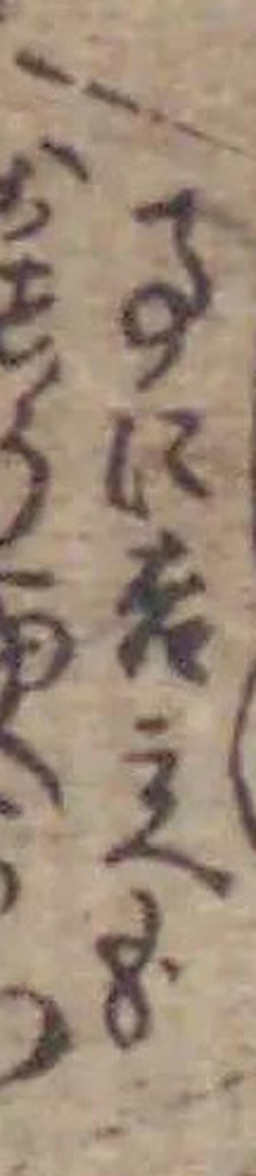おしうしゆへよろ
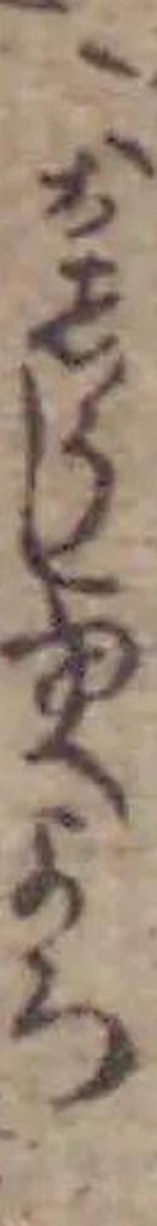おしうしゆへよろ
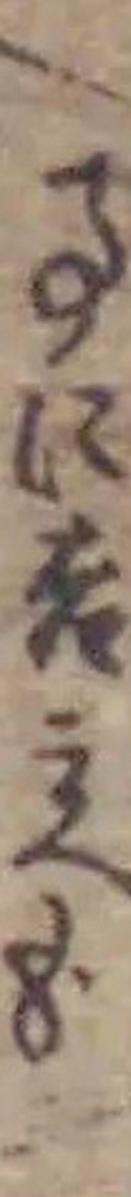事に吉兵衛も
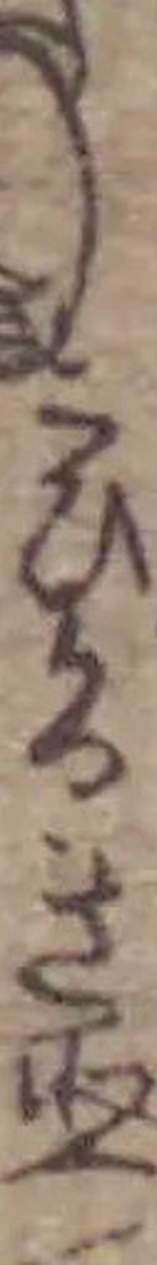こひかるき所へ
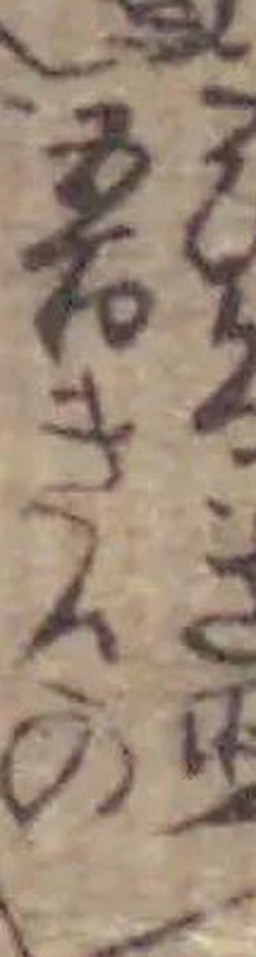五百きんの
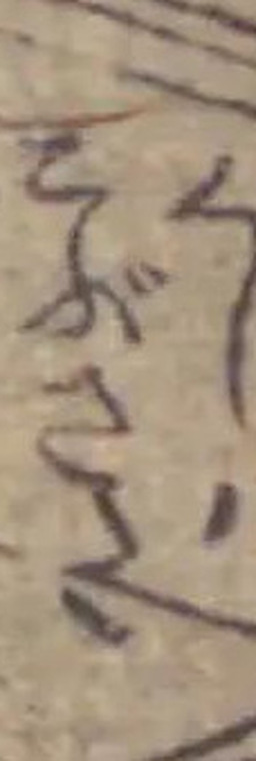ごぶさた
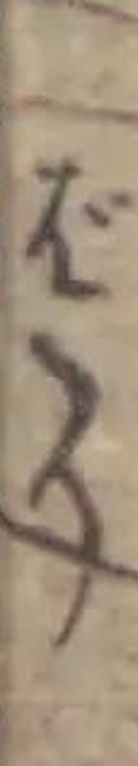ばかり
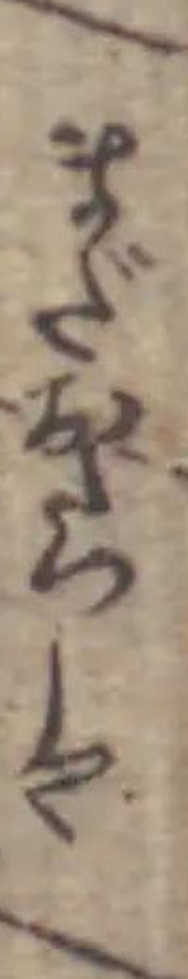まだおたつしや
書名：虚言弥二郎傾城誠 3巻
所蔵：国立国会図書館 National Diet Library, JAPAN
